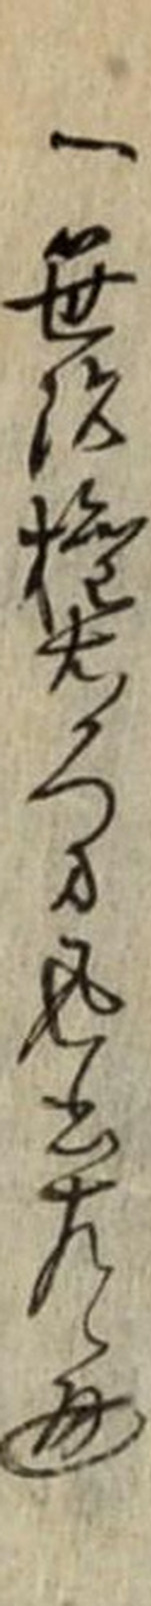一笹治権右衛門方返書左之通
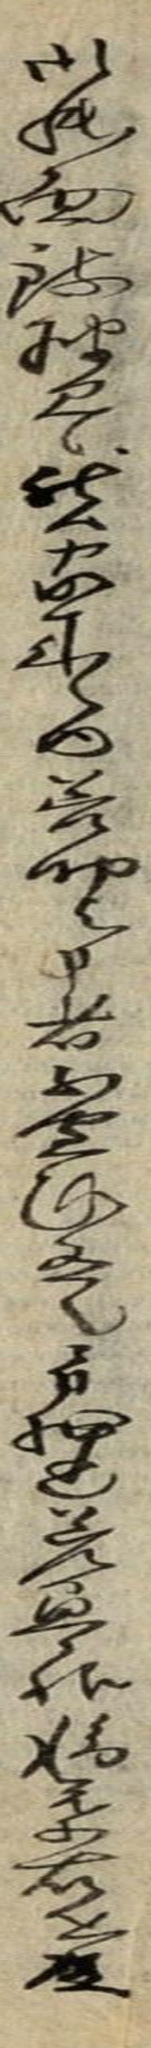御紙面致披見候然は家来之内善助と申者不宜趣有之候付押込差置候様稻葉右近殿
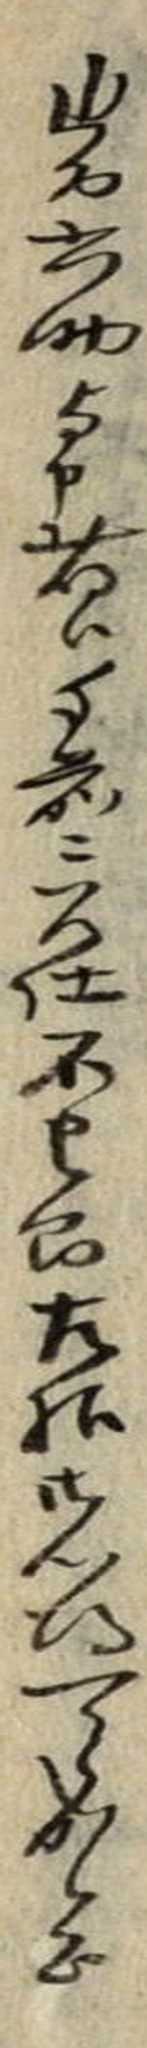追而六助と申者は手前に召仕不申候間左様御心得可被成候以上
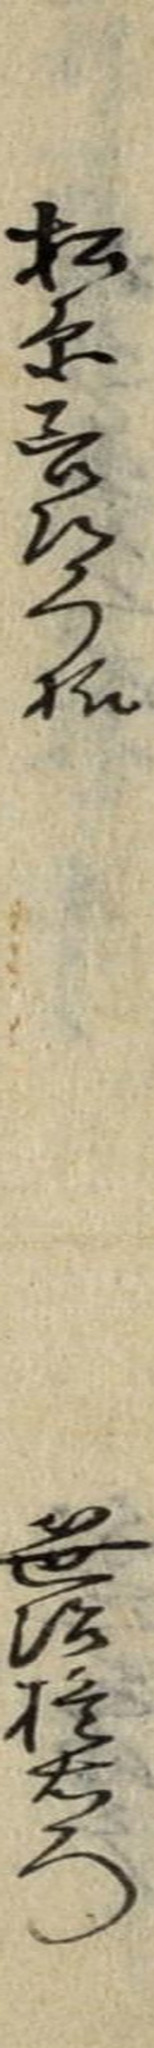松原善左衛門様笹治権右衛門
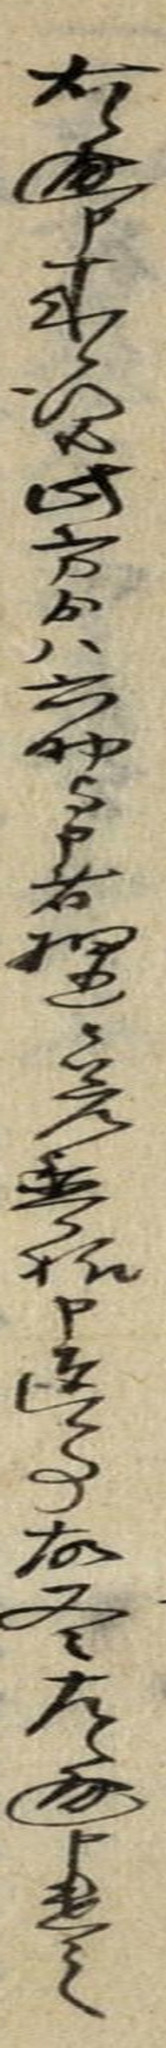右之通申来候得共此方ゟは六助と申者押込被差置候様申達候事故又々左之通申遣之
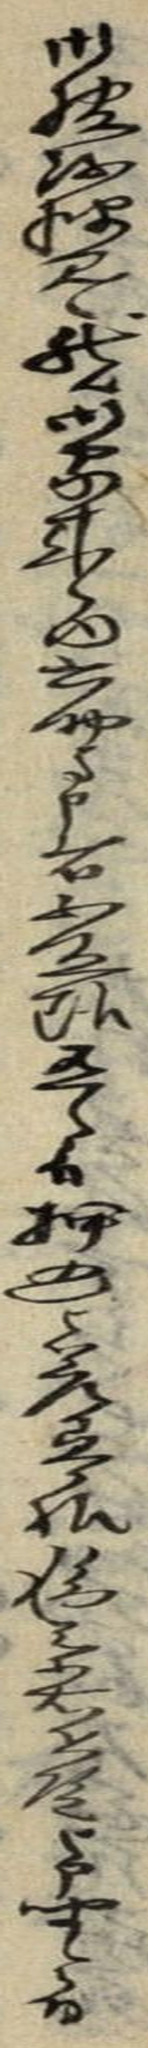御報致披見候然は御家来之内六助と申者不宜趣有之に付押込被差置候様稻葉右近殿被申聞候ニ付
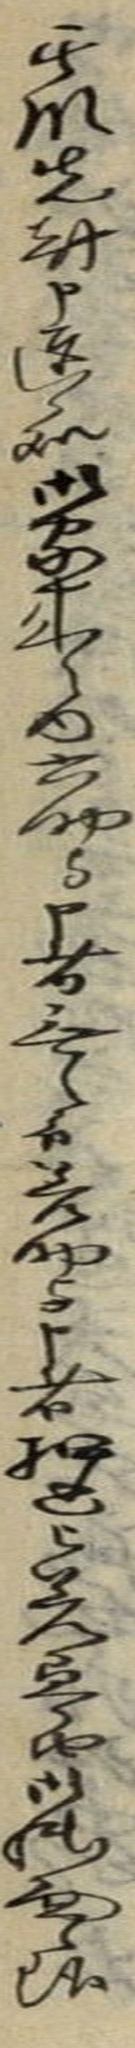其段先刻申達候処御家来之内六助と申者無之候に付善助と申者押込被差置候由御紙面之趣
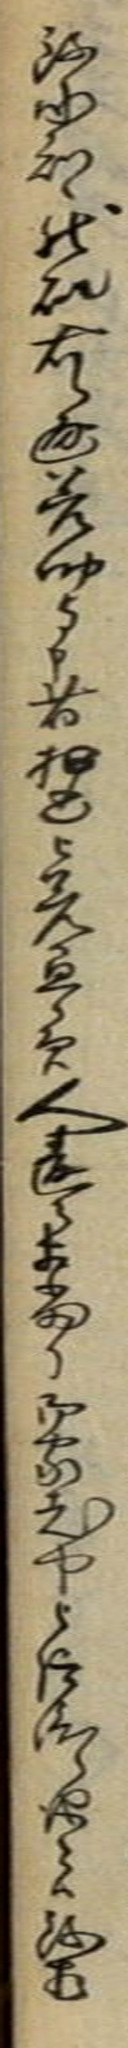致承知候然処右之通善助と申者押込被差置候而は人違に相当り御家老中被仰渡候儀には致相
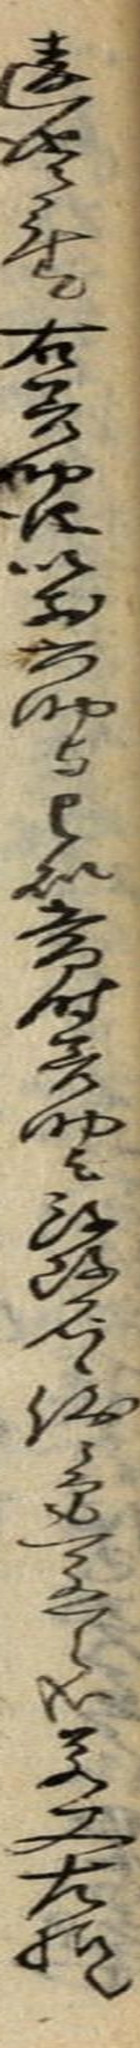違儀に御座候右善助儀以前六助と申候処当時善助と致改名候儀に而も有之候哉且又左様之
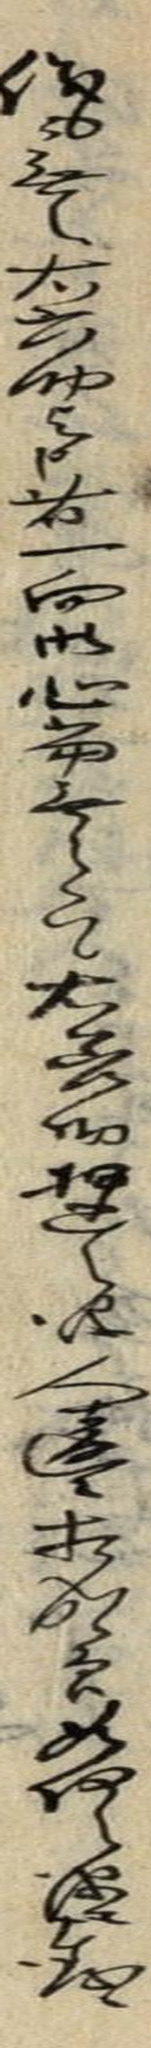儀も無之右六助と申者一向御心当無之候はゝ右善助押込候儀人違に相成候而は如何之儀に奉存候
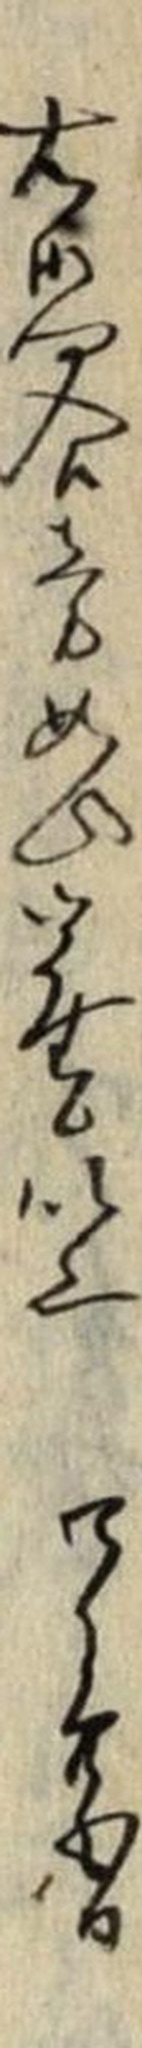右御問合旁如此御座候以上四月廿五日
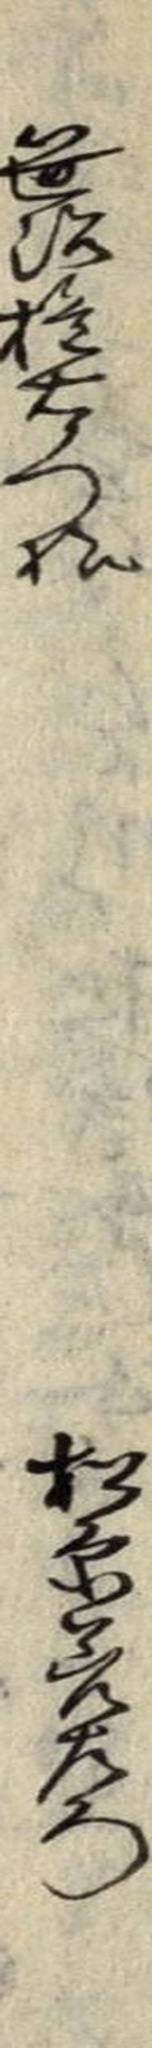笹治権右衛門様松原善左衛門
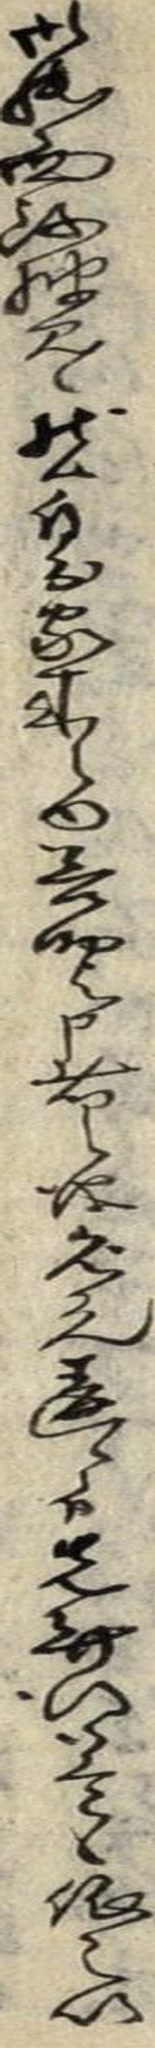御紙面致披見候然は自分家来之内善助と申者之儀名元違候に付先刻得御意候依之以
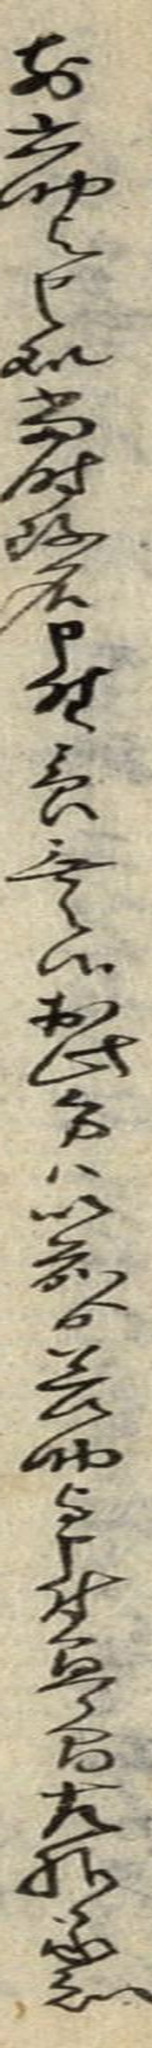前六助と申候処当時改名申付候而は無之候於此方は以前ゟ善助と申付置候間左様承知
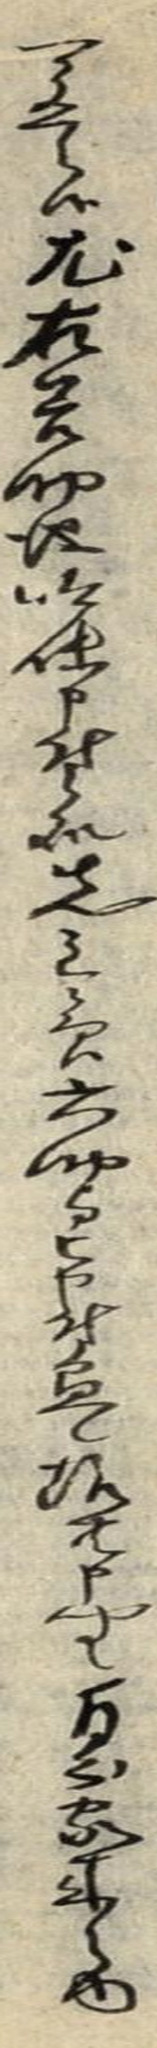可有之候尤右善助儀吟味申付候処先主に而は六助と被申付置候趣共申聞候自分家来之内
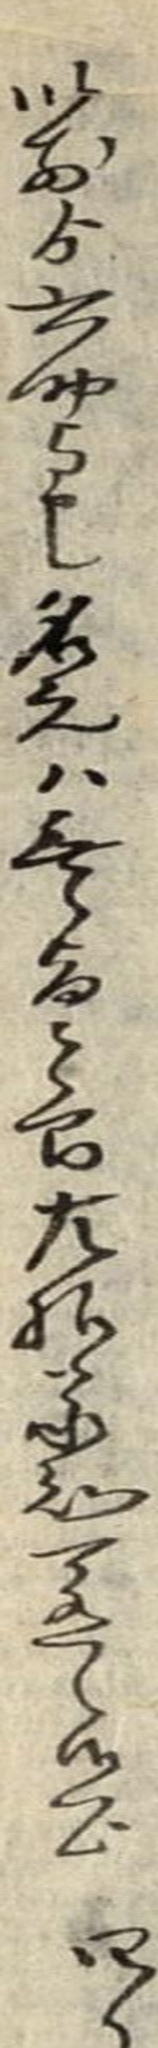以前ゟ六助と申候名元は無之旨に候間左様御承知可有之候以上四月廿五日
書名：蒐輯之部
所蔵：福井県文書館 Fukui Prefectural Archives
